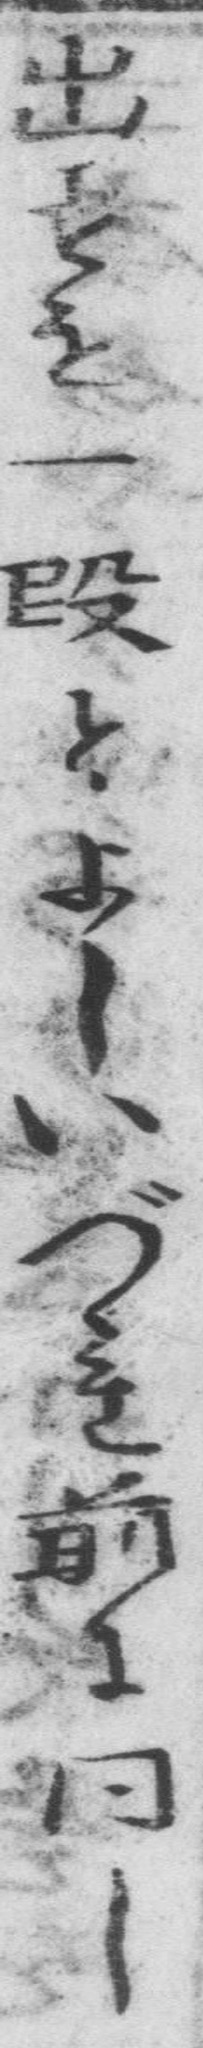出すも一段とよしいづれ前に同し
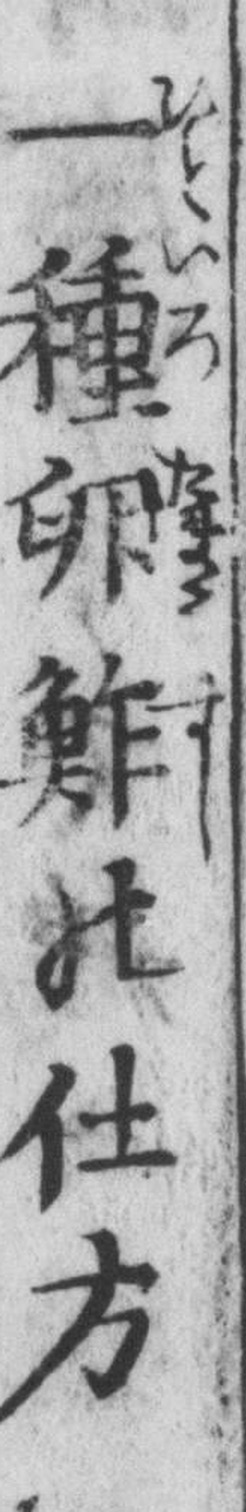一種卵鮓の仕方
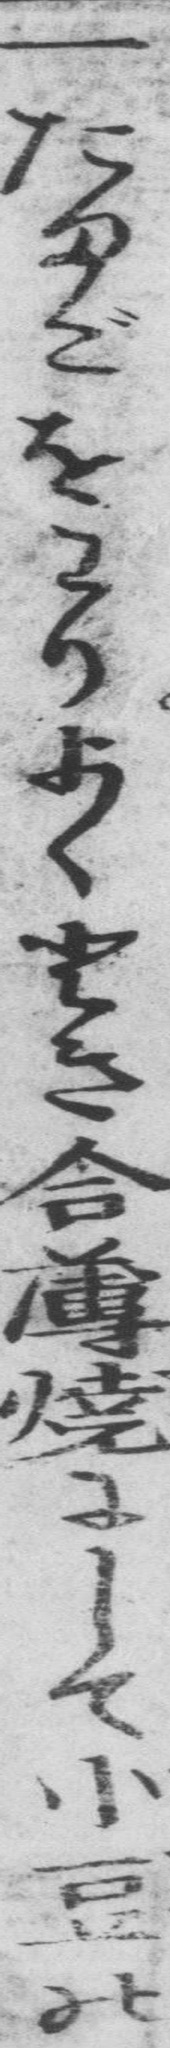一たまごをわり。よくとき合薄焼にして小豆の
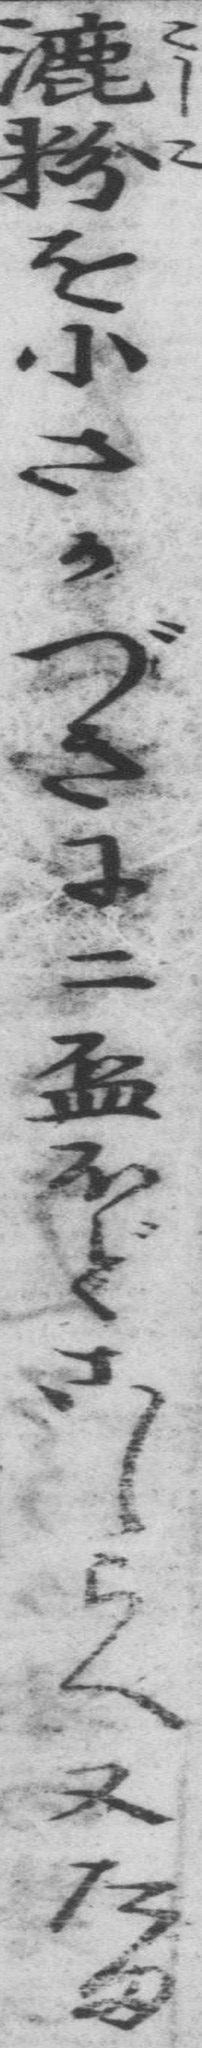漉粉を小さかづきに二盃ほどこしらへ又たま

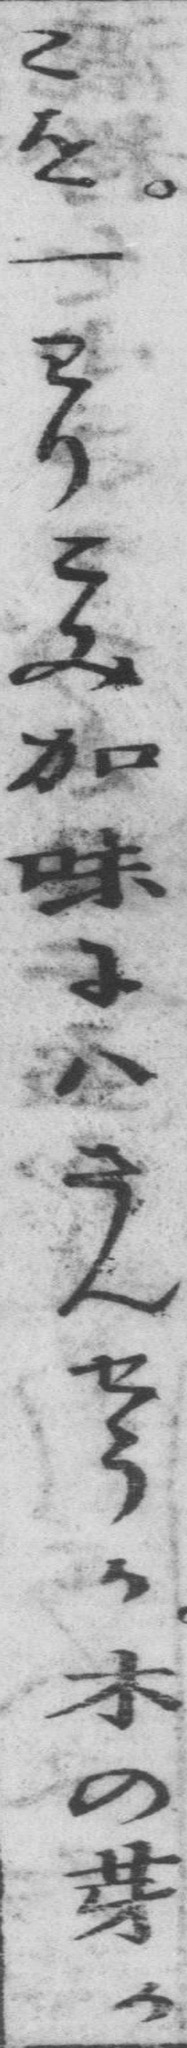こを。一わりこみ加味にはさんせうか。木の芽か
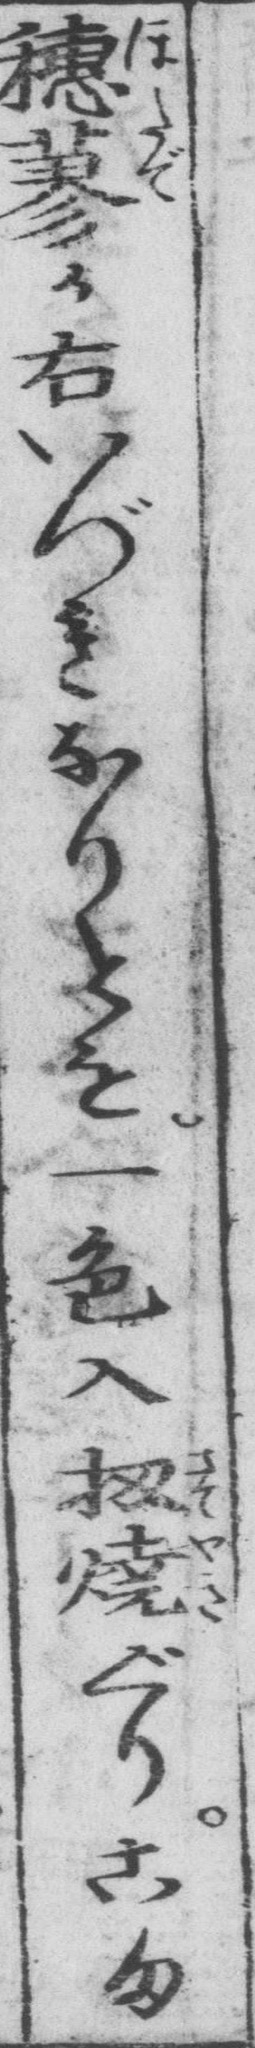穂蓼か右いづれなりとも。一色入扨焼ぐり。こま
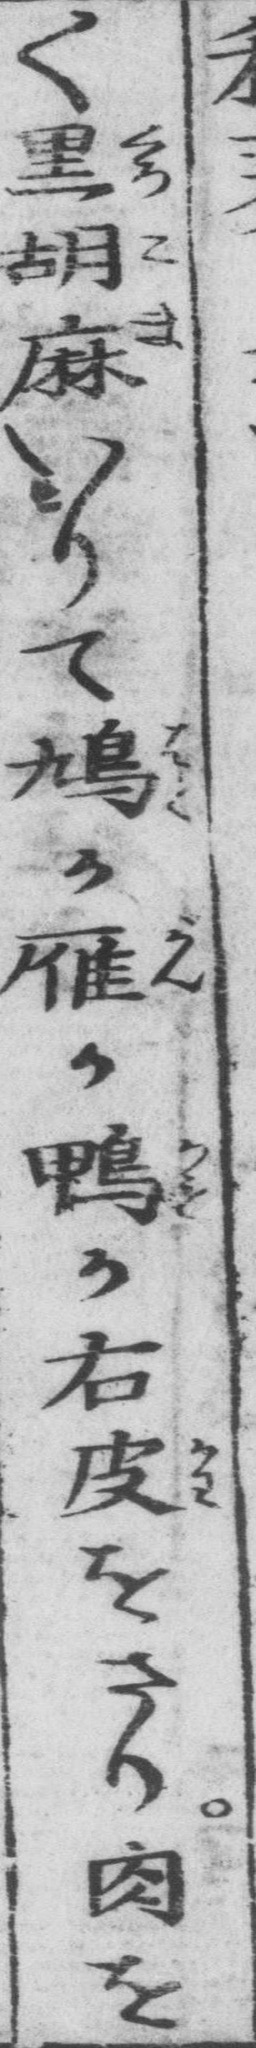〳〵黒胡麻いりて鳩か雁か鴨か右皮をさり。肉を
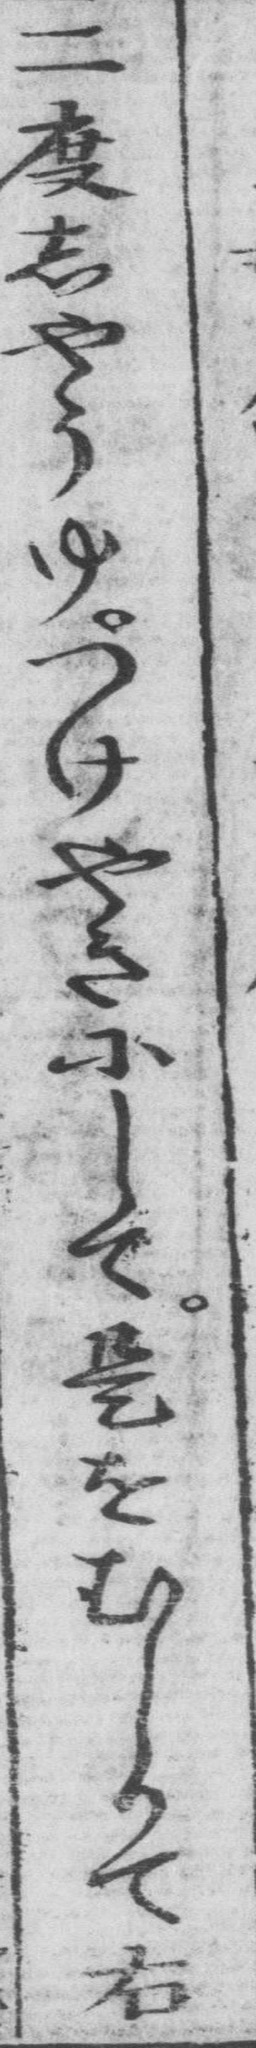二度しやうゆ。つけやきにして。是をむしりて右
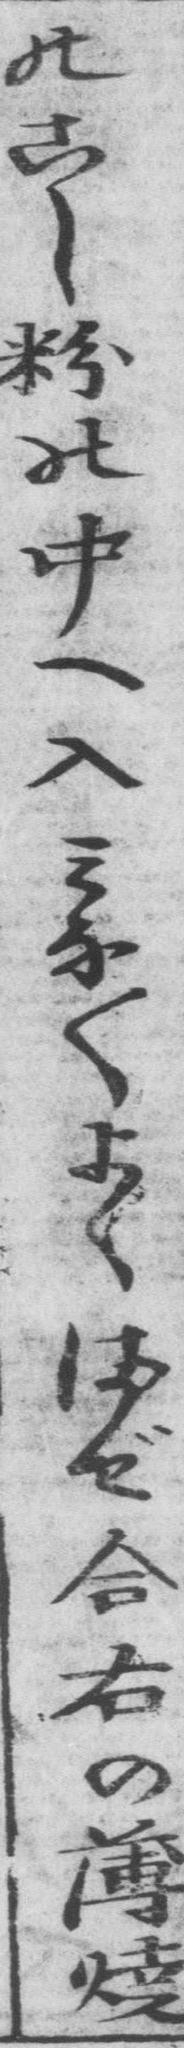のこし粉の中へ入みな〳〵よくまぜ合。右の薄焼
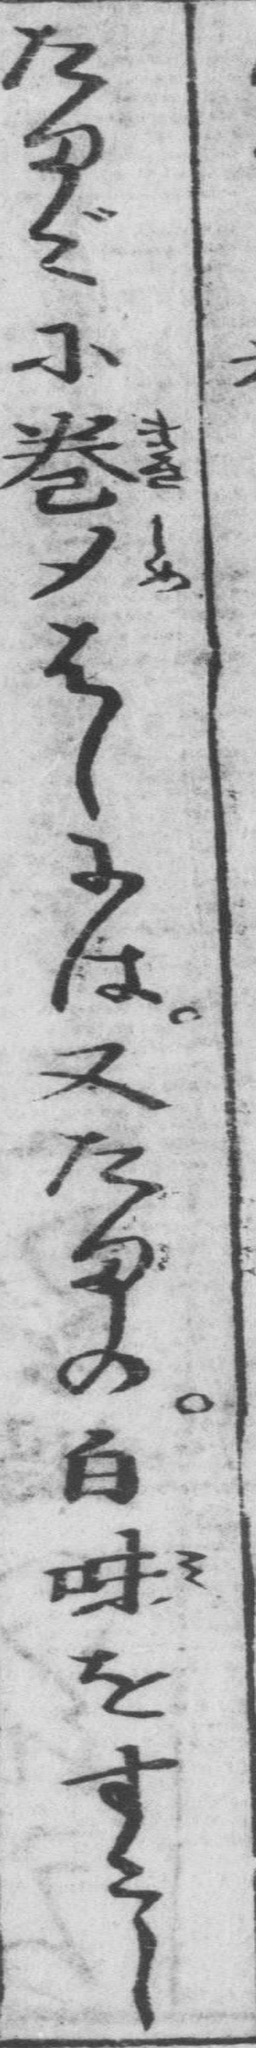たまごに巻〆はしには。又たまの。白味をすこし
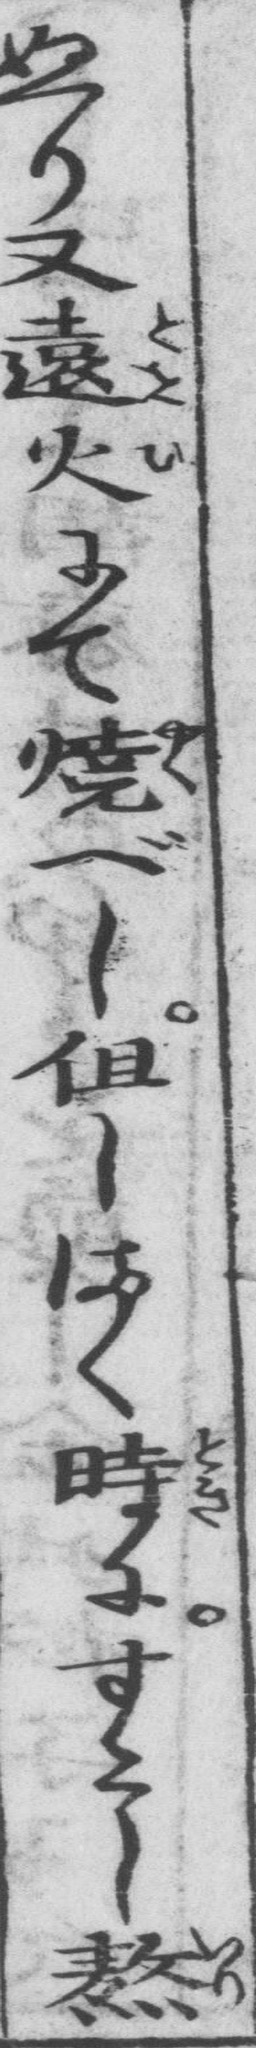ぬり又遠火にて焼べし。但しまく時に。すこし熬
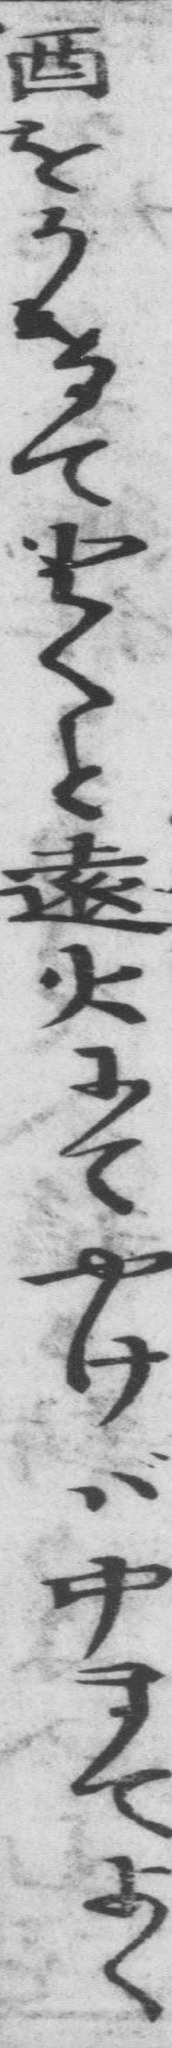酒をかけてとくと。遠火にてやけば。中まてよく
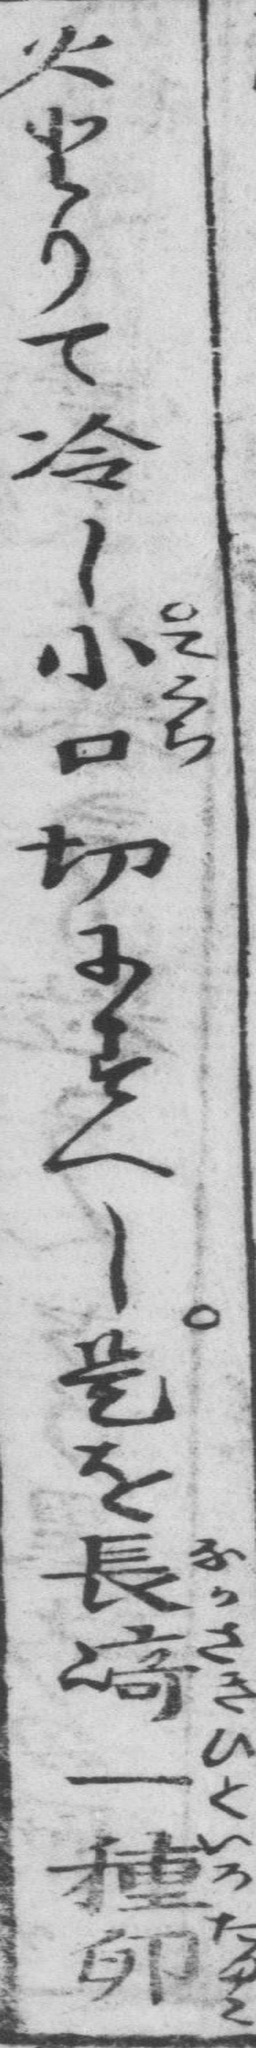火とりて冷し。小口切にすへし。是を長崎一種卵
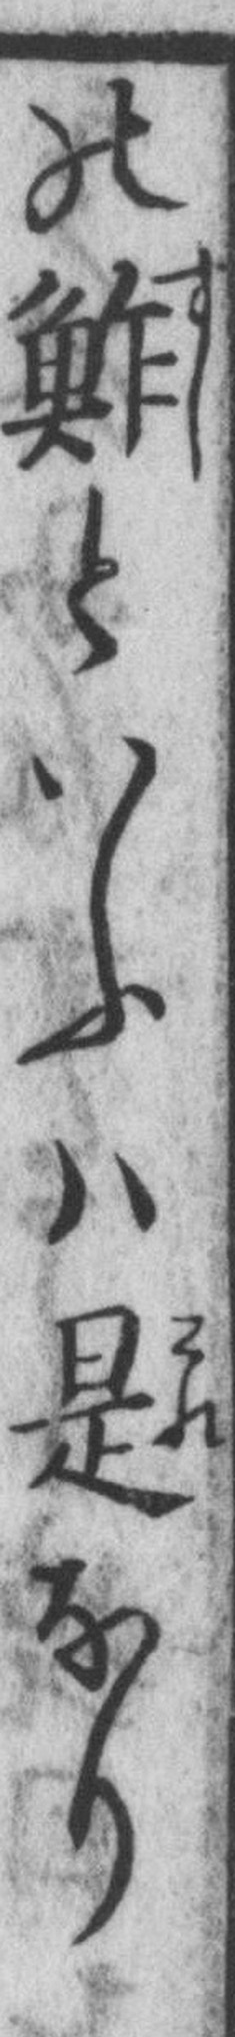の鮓といふは是なり
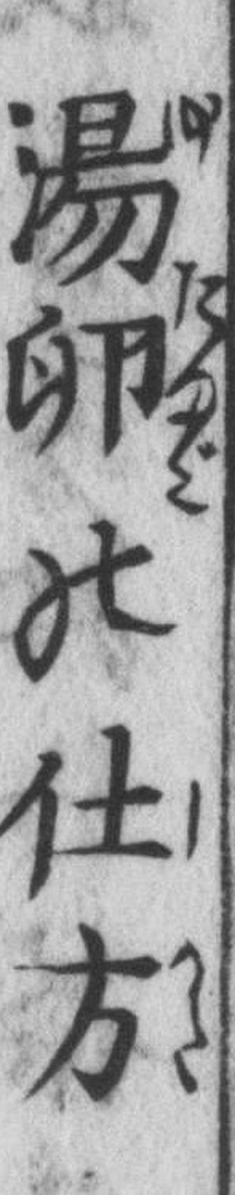湯卵の仕方
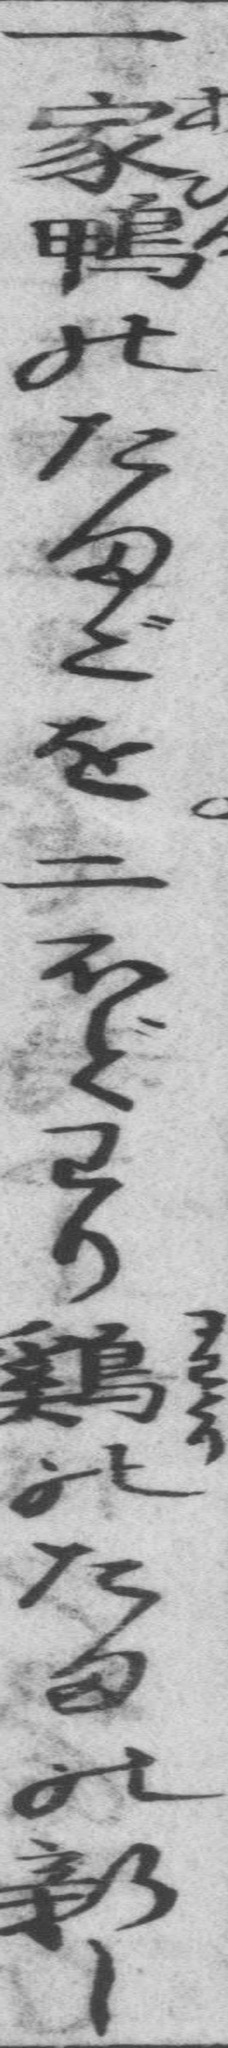一家鴨のたまごを。二ほどわり鶏のたまの新し
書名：萬寳料理秘密箱
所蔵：大阪府立大学学術情報センター 国文学研究資料館
